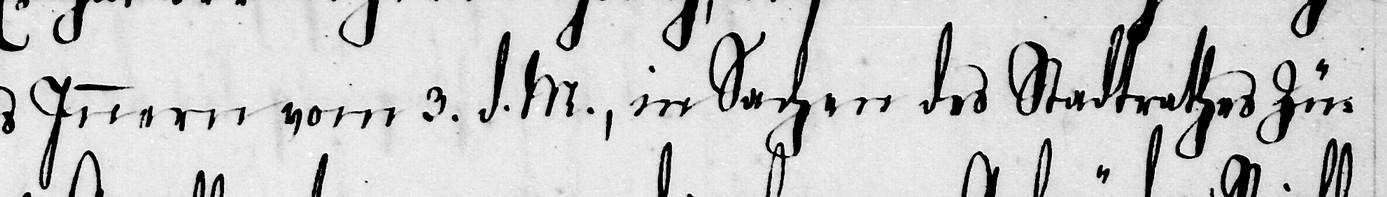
Innern vom 3. d. M., in Sachen des Stadtrathes Zü¬
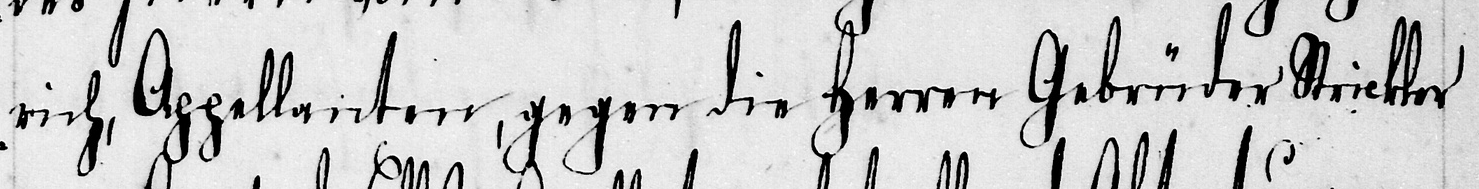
rich, Appellanten, gegen die Herren Gebrüder Strickler
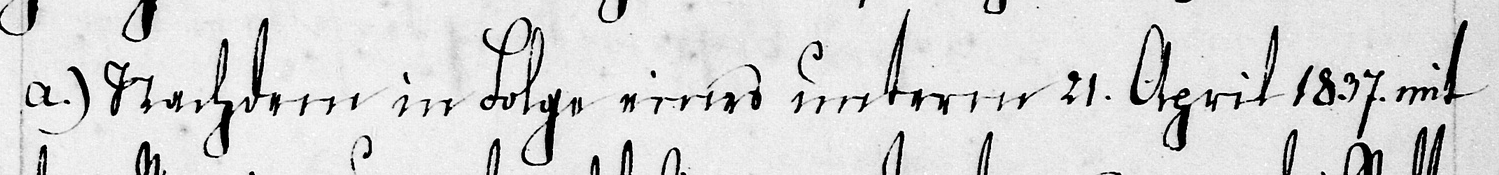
a.) Nachdem in Folge eines unterm 21. April 1837. mit
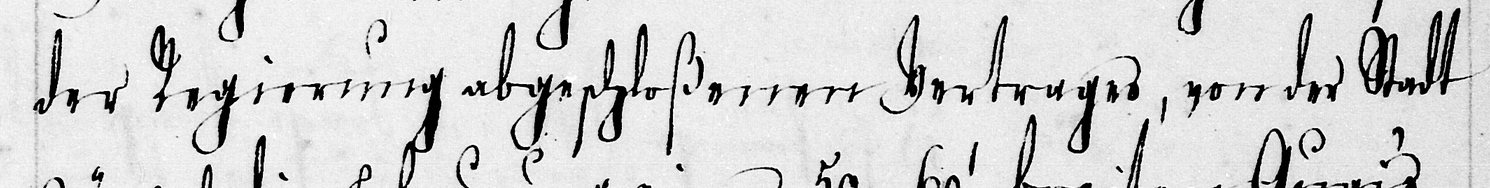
der Regierung abgeschloßenen Vertrages, von der Stadt
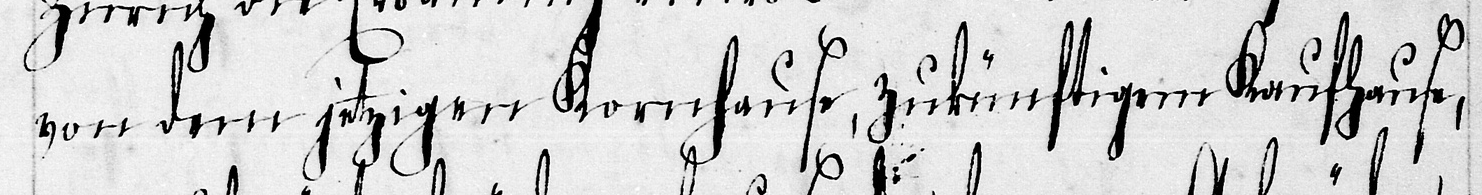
von dem jetzigen Kornhause, zukünftigem Kaufhause,
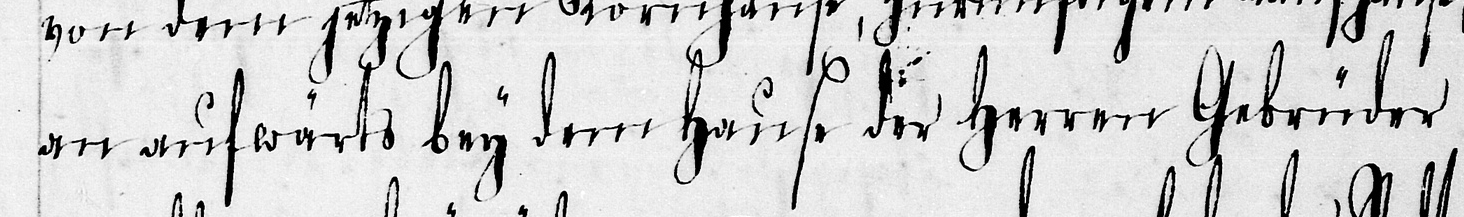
an aufwärts bey dem Hause der Herren Gebrüder
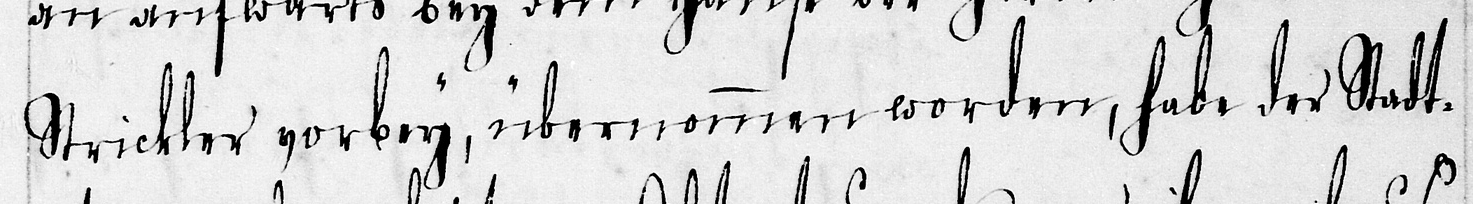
Strickler vorbey, übernommen worden, habe der Stadt¬
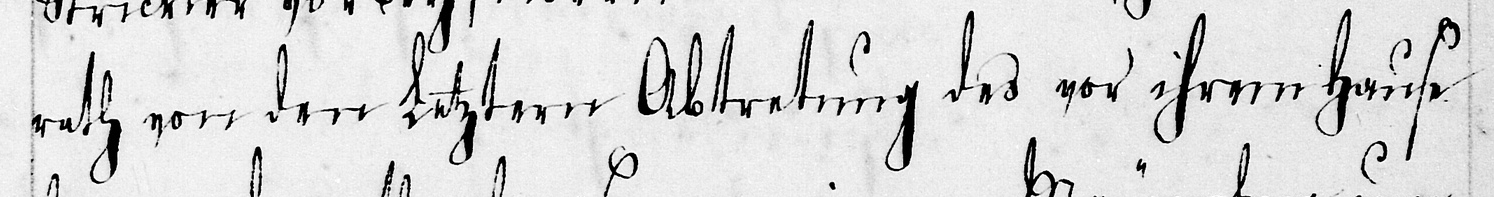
rath von den Letztern Abtretung des vor ihrem Hause
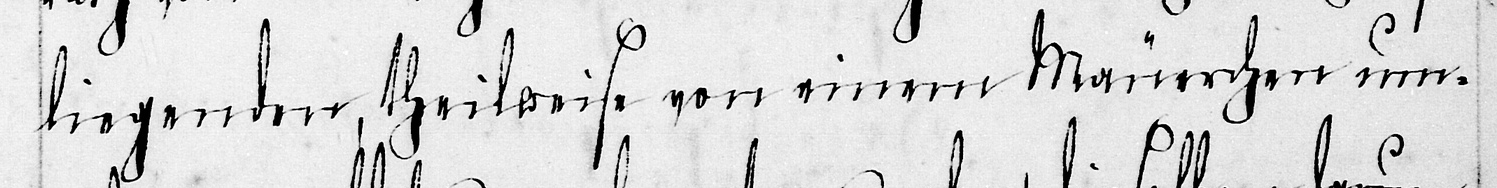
liegenden, theilweise von einem Mäuerchen um¬
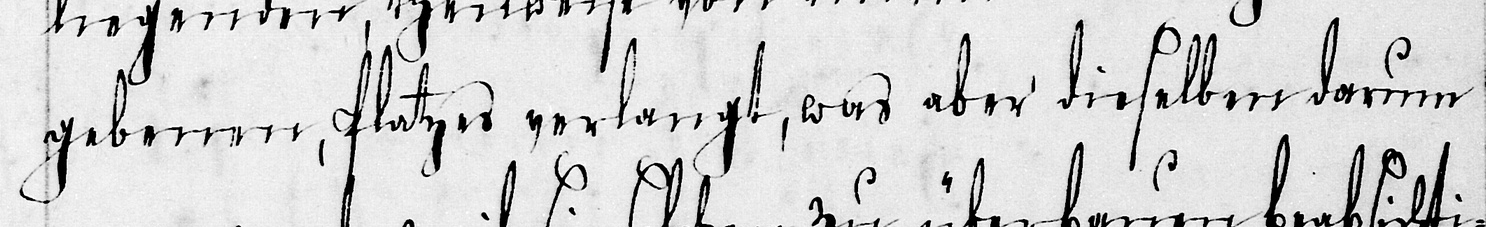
gebenen, Platzes verlangt, was aber dieselben darum
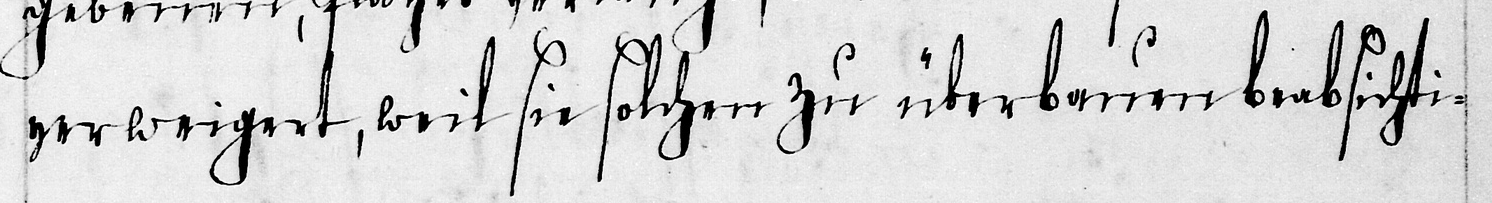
verweigert, weil sie solchen zu überbauen beabsichti¬
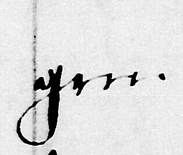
gen.
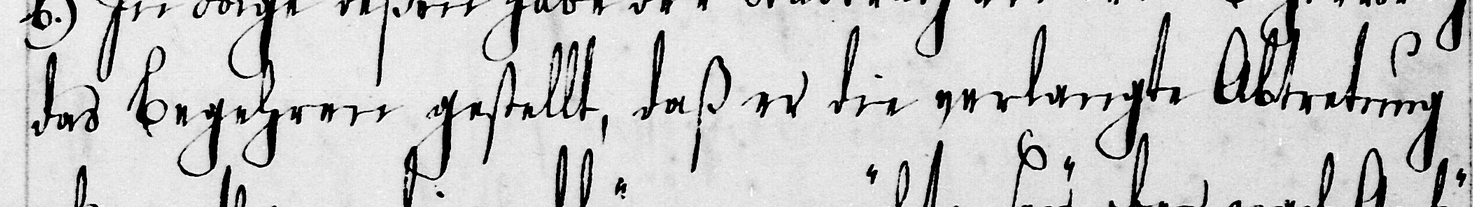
das Begehren gestellt, daß er die verlangte Abtretung
